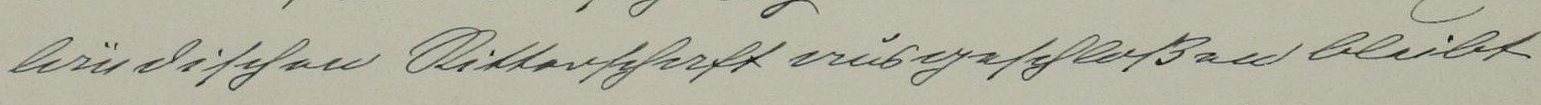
ländischen Ritterschaft ausgeschloßen bleibt
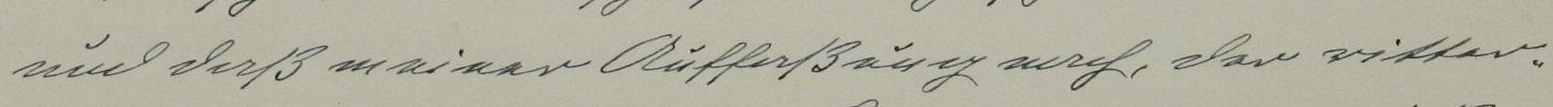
und daß meiner Auffaßung nach, der ritter-
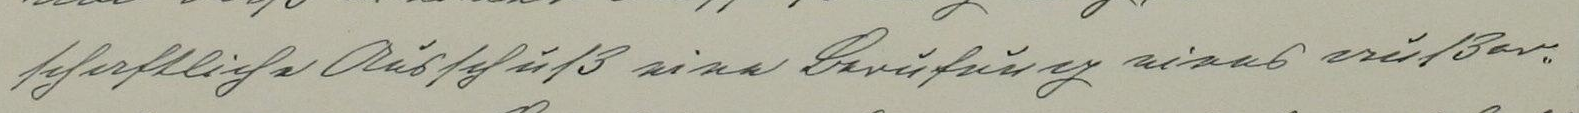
schaftliche Ausschuß eine Berufung eines außer-
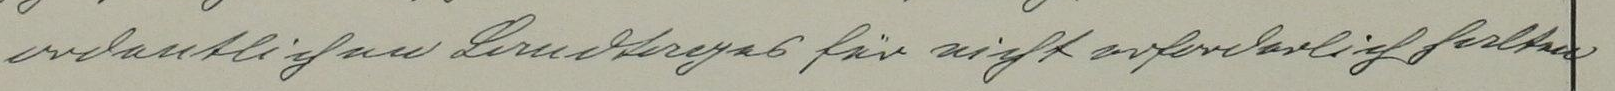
ordentlichen Landtages für nicht erforderlich halten
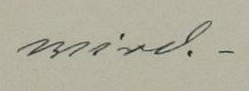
wird. -
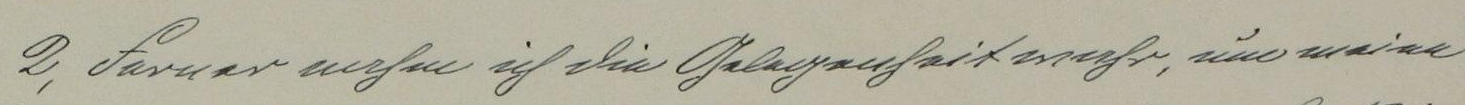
2. Ferner nahm ich die Gelegenheit wahr, um meine
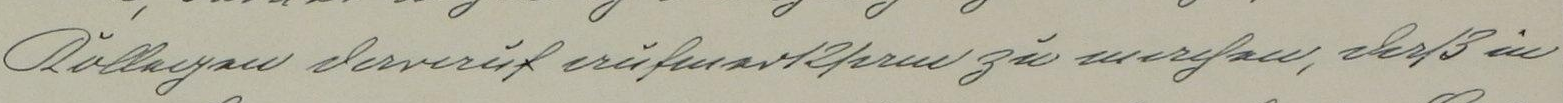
Kollegen darauf aufmerksam zu machen, daß in
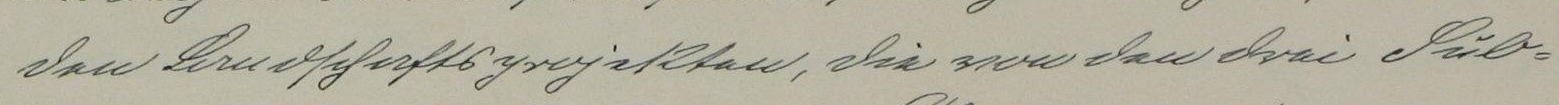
den Landschaftsprojekten, die von den drei Sub-
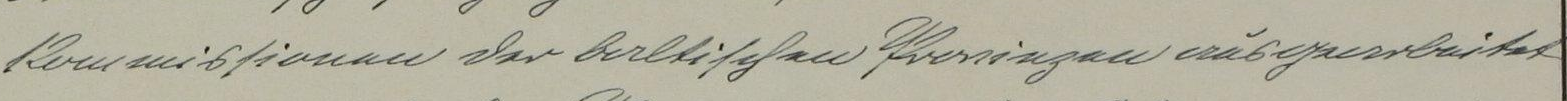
kommissionen der baltischen Provinzen ausgearbeitet
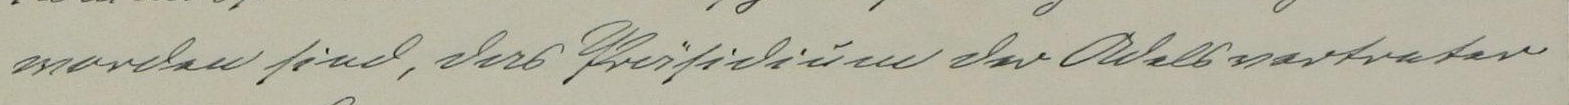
worden sind, das Präsidium der Adelsvertreter
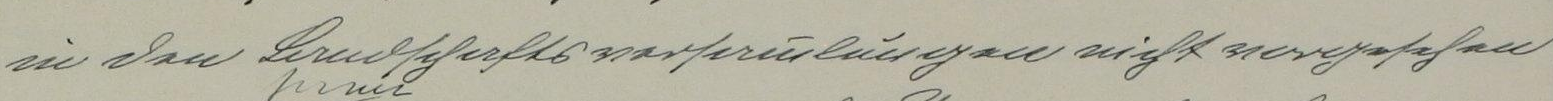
in den Landschaftsversammlungen nicht vorgesehen
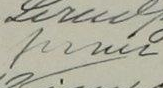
somit
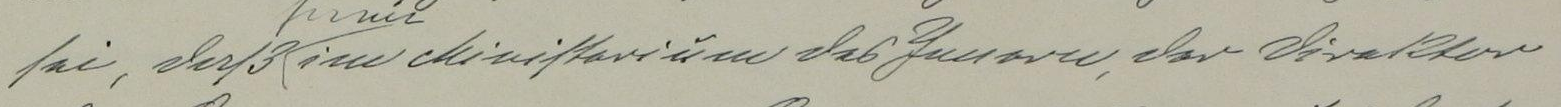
sei, daß im Ministerium des Innern, der Direktor
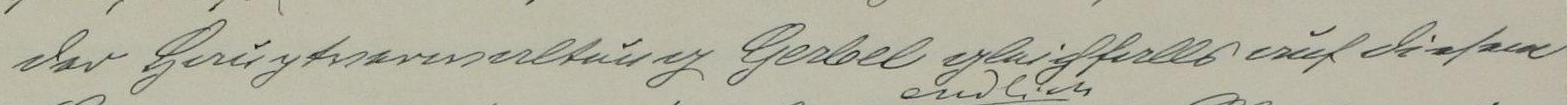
der Hauptverwaltung Gerbel gleichfalls auf diesem
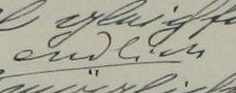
endlich
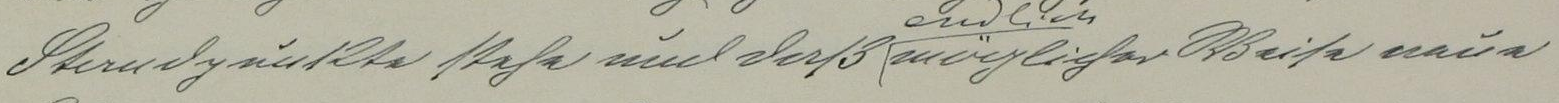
Standpunkte stehe und daß möglicher Weise neue
